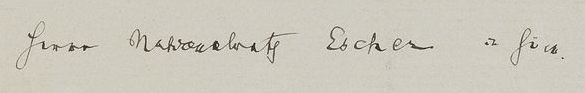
Herrn Nationalrath Escher in hier.
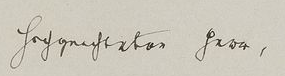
Hochgeachteter Herr,
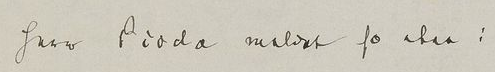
Herr Pioda meldet so eben:
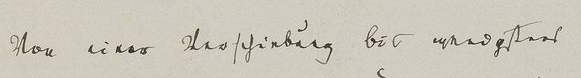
«Von einer Verschiebung bis wenigstens
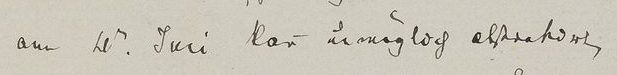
am 4t Juni kann unmöglich abstrahirt
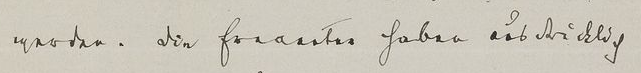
werden. Die Ernannten haben ausdrücklich
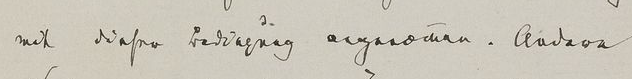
mit dieser Bedingung angenommen. Andere
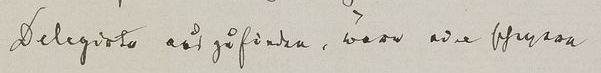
Delegirte auszufinden, wäre eine schwere
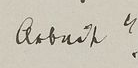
Arbeit.»
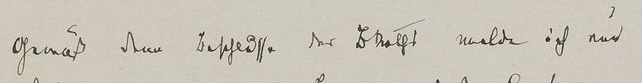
Gemäß dem Beschlusse des BRaths melde ich nun
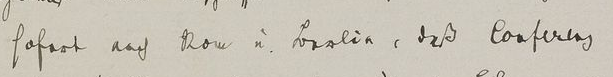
sofort nach Rom u. Berlin, daß Conferenz
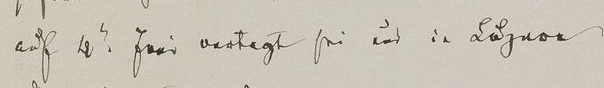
auf 4t Juni vertagt sei und in Luzern
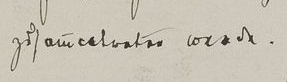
zusammentreten werde.
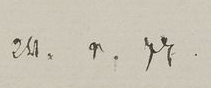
24. V. 77.
